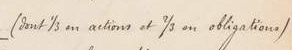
(dont ⅓ en actions et ⅔ en obligations)
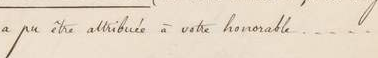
pu être attribuée à votre honorable......
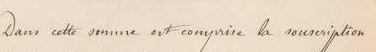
Dans cette somme est comprise la souscription
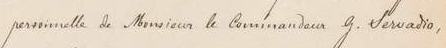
personnelle de Monsieur le Commandeur G. Servadio,
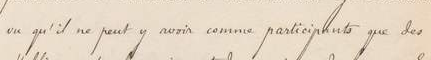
vu qu'il ne peut y avoir comme participants que des
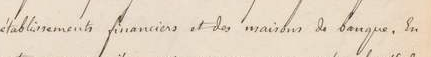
établissements financiers et des maisons de banque. En
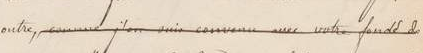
outre, comme j'en suis convenu avec votre fondé de
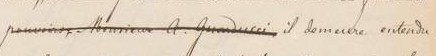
pouvoirs Monsieur A. Guarducci il demeure entendu
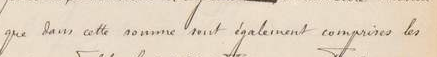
que dans cette somme sont également comprises les
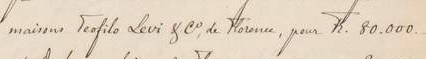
maisons Teofilo Levi & Co, de Florence, pour Fr. 80.000.–
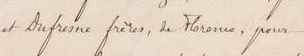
et Dufresne frères, de Florence, pour
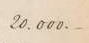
20.000.–
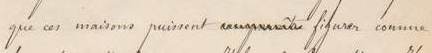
que ces maisons puissent comparaître figurer comme
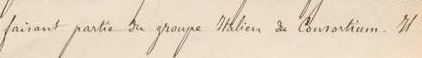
faisant partie du groupe Italien du Consortium. Il
